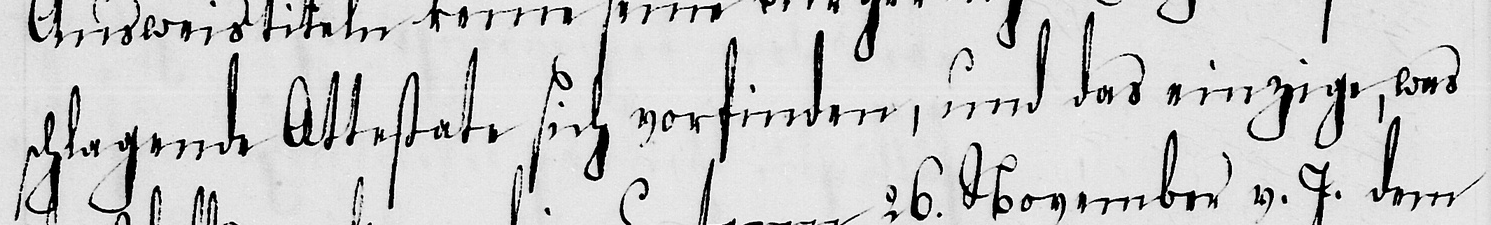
schlagende Attestate sich vorfinden, und das einzige, was
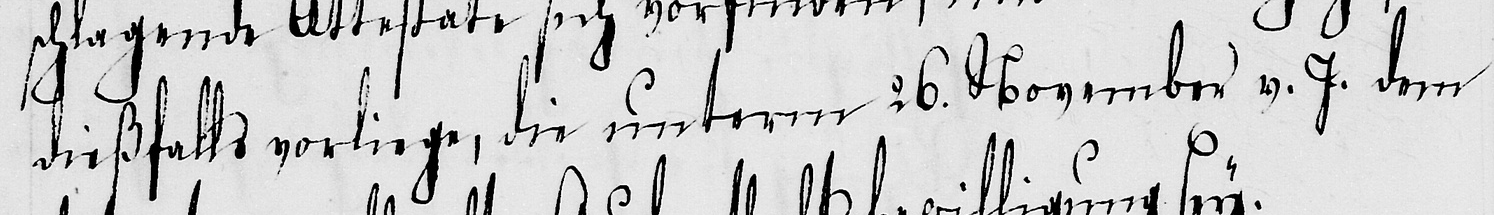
dießfalls vorliege, die unterm 26. November v. J. dem
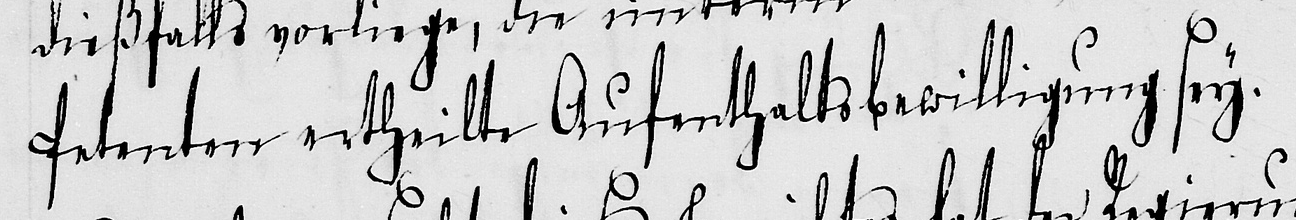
Petenten ertheilte Aufenthaltsbewilligung sey.
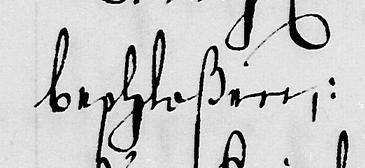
beschloßen,:
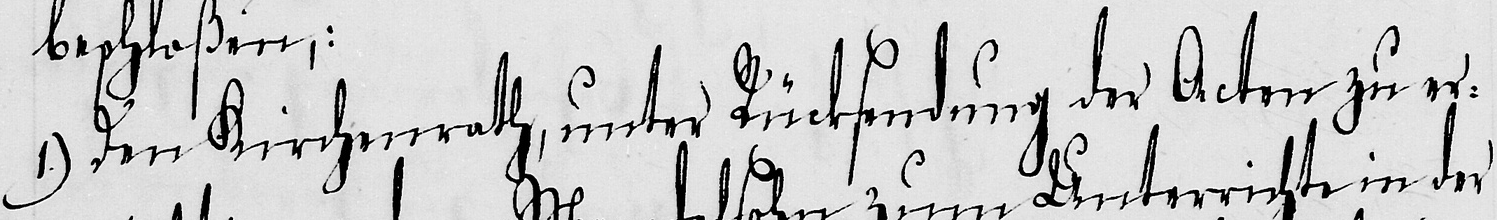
1.) Den Kirchenrath, unter Rücksendung der Acten zu er¬
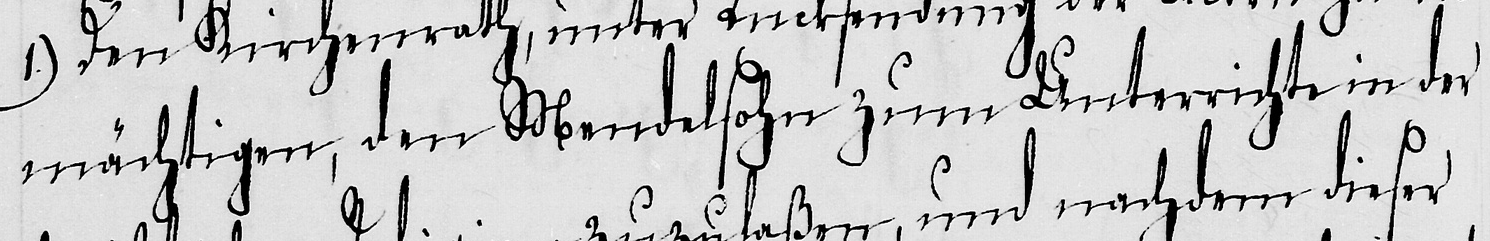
mächtigen, den Mendelsohn zum Unterrichte in der
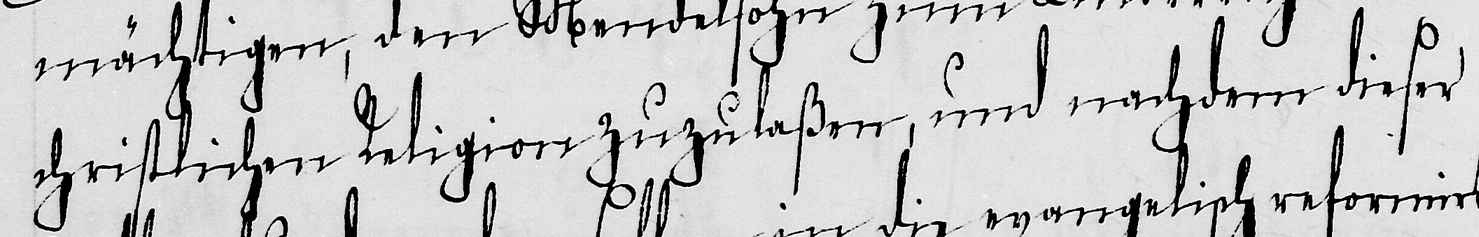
christlichen Religion zuzulaßen, und nachdem dieser
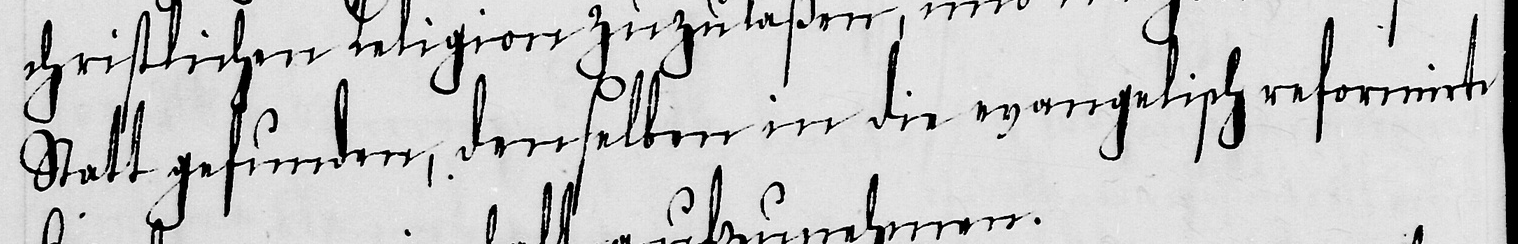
Statt gefunden, denselben in die evangelisch reformirte
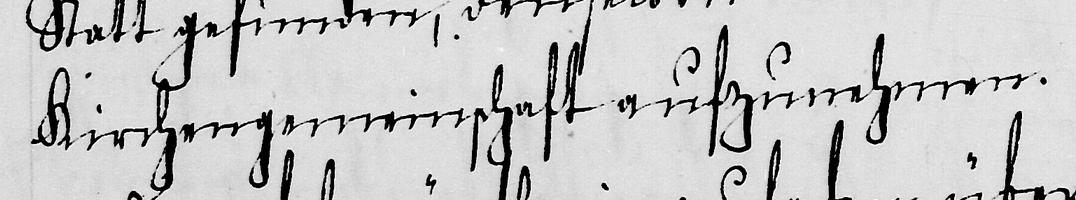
Kirchengemeinschaft aufzunehmen.
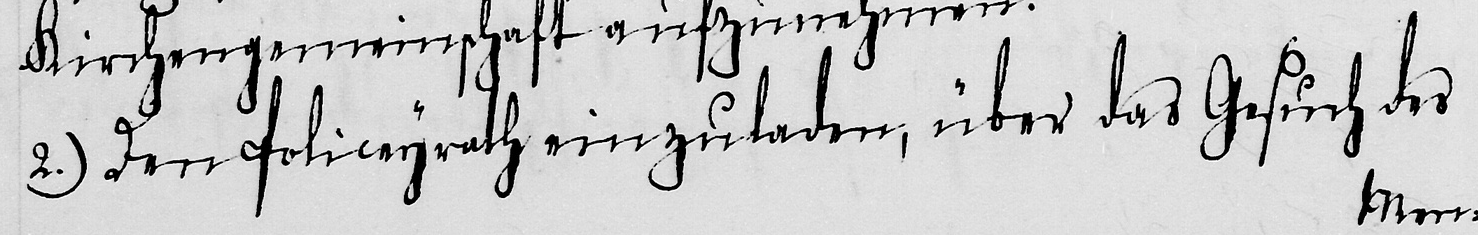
2.) Den Policeyrath einzuladen, über das Gesuch des
